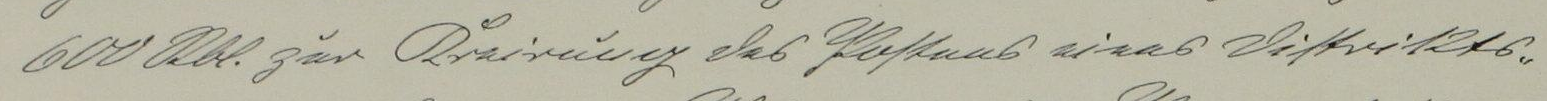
600 Rbl. zur Kreirung des Postens eines Distrikts-
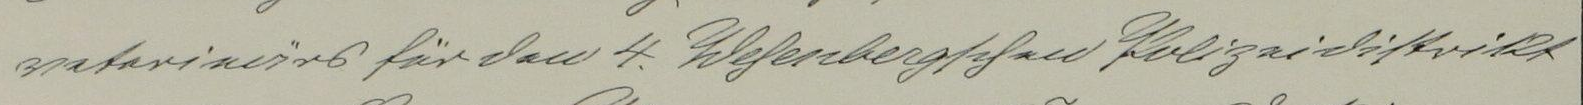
veterinärs für den 4. Wesenbergschen Polizeidistrikt
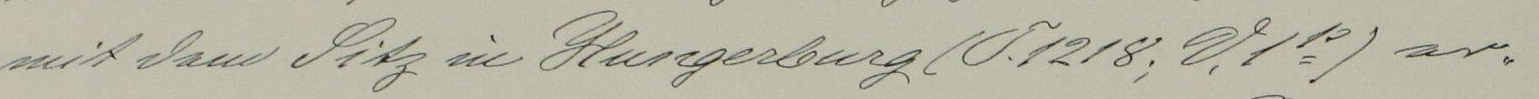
mit dem Sitz in Hungerburg (T.1218; V.1p) er-
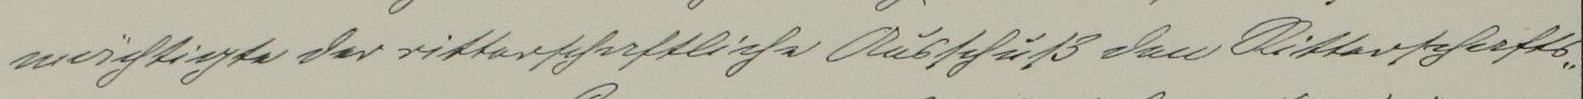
mächtigte der ritterschaftliche Ausschuß den Ritterschafts-
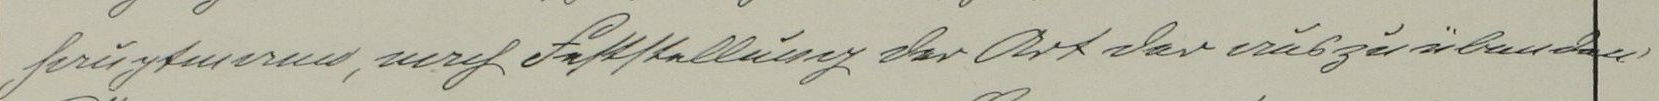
hauptmann, nach Feststellung der Art der auszuübenden
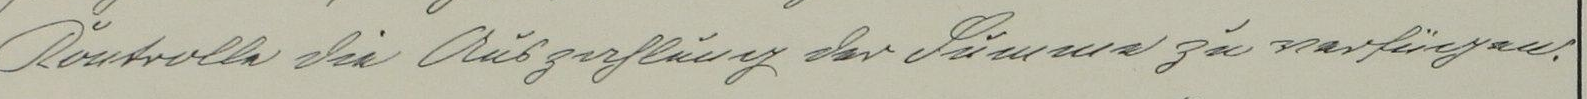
Kontrolle die Auszahlung der Summe zu verfügen.
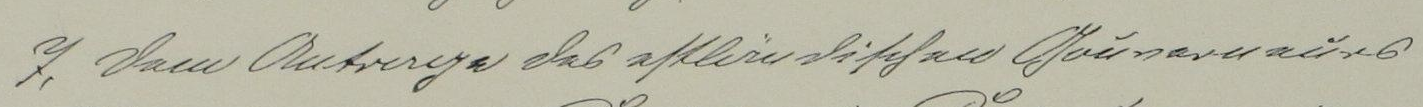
7. Dem Antrage des estländischen Gouverneurs
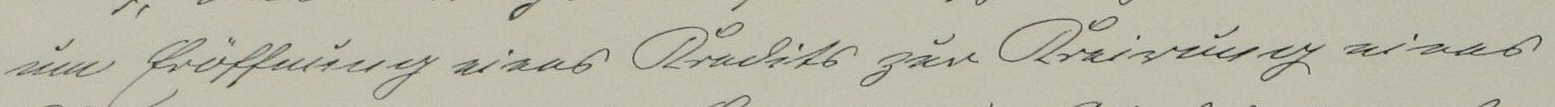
um Eröffnung eines Kredits zur Kreierung eines
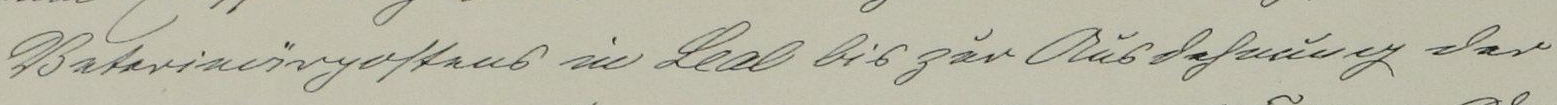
Veterinärpostens in Leal bis zur Ausdehnung der
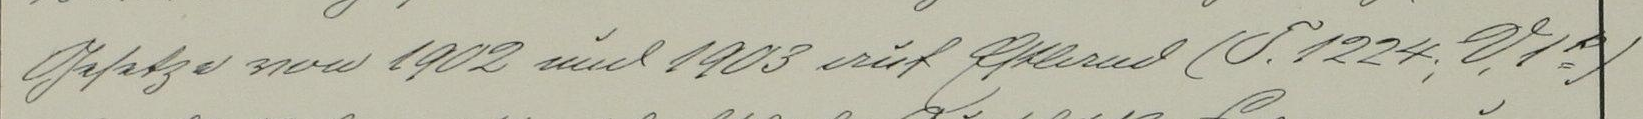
Gesetze von 1902 und 1903 auf Estland (T.1224; V.1p)
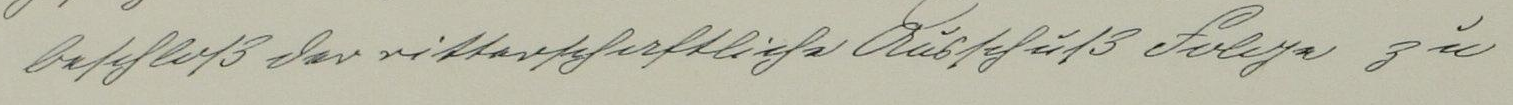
beschloß der ritterschaftliche Ausschuß Folge zu
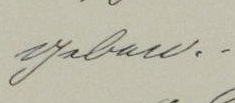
geben.
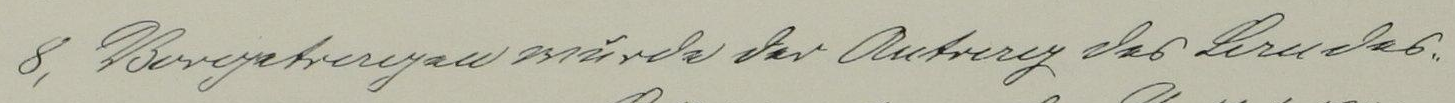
8. Vorgetragen wurde der Antrag des Landes-
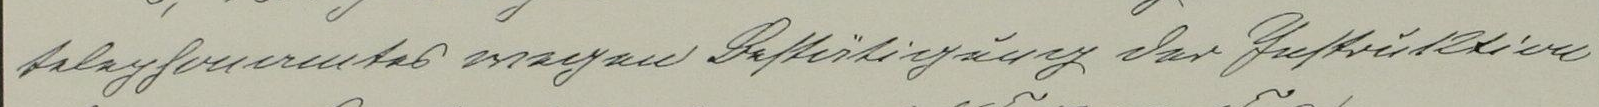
telephonamtes wegen Bestätigung der Instruktion
